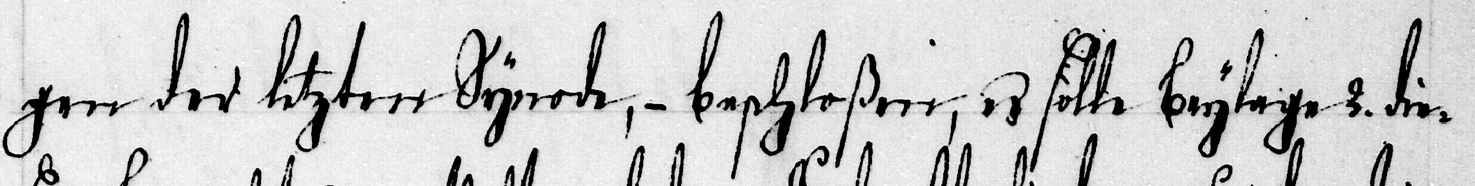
gen der letzten Synode, – beschloßen, es solle Beylage
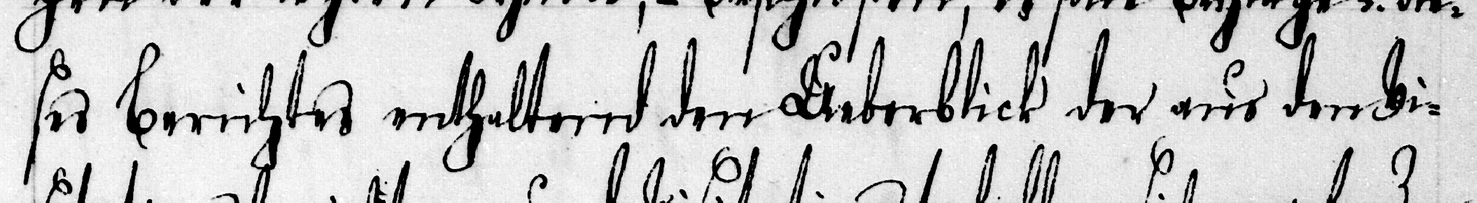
ses Berichtes enthaltend den Ueberblick der aus den Vi¬
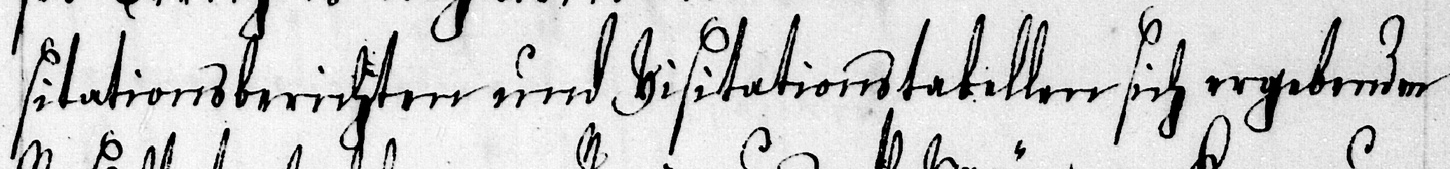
sitationsberichten und Visitationstabellen sich ergebenden
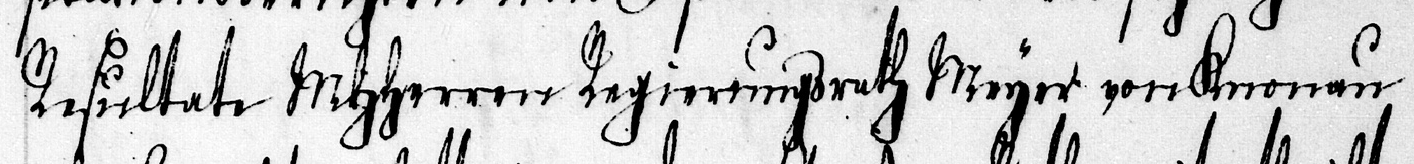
Resultate MHHerren Regierungsrath Meyer von Knonau
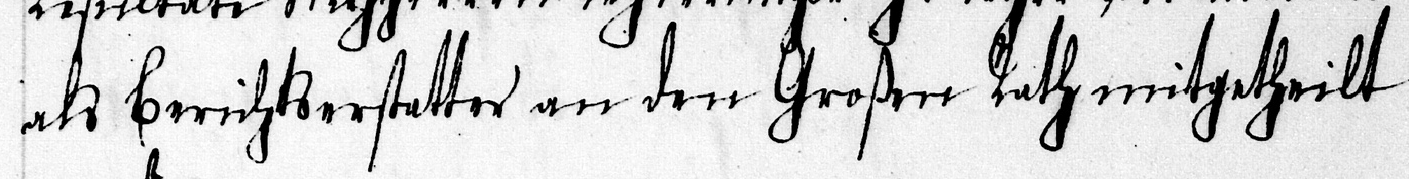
als Berichtserstatter an den Großen Rath mitgetheilt
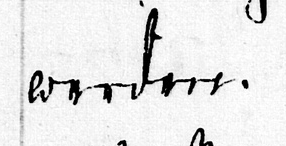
werden.
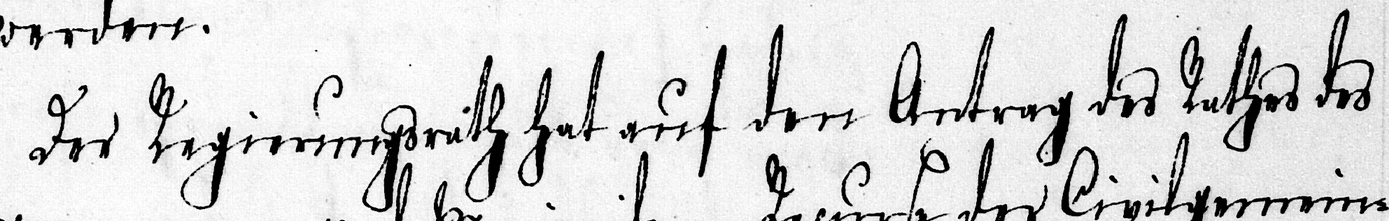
Der Regierungsrath hat auf den Antrag des Rathes
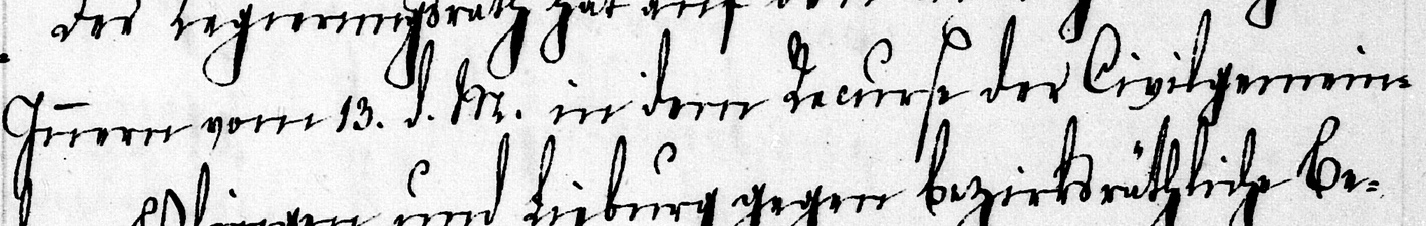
Innern vom 13. d. M. in dem Recurse der Civilgemein¬
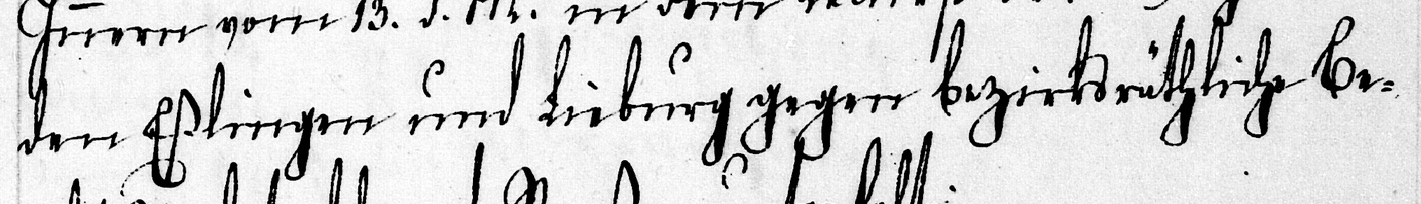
den Eßlingen und Lieburg gegen bezirksräthliche Be¬
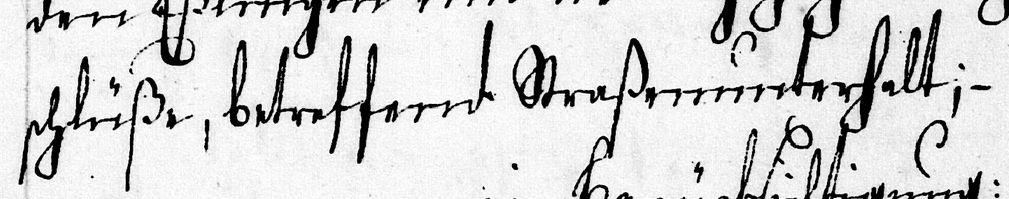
schlüße, betreffend Straßenunterhalt;
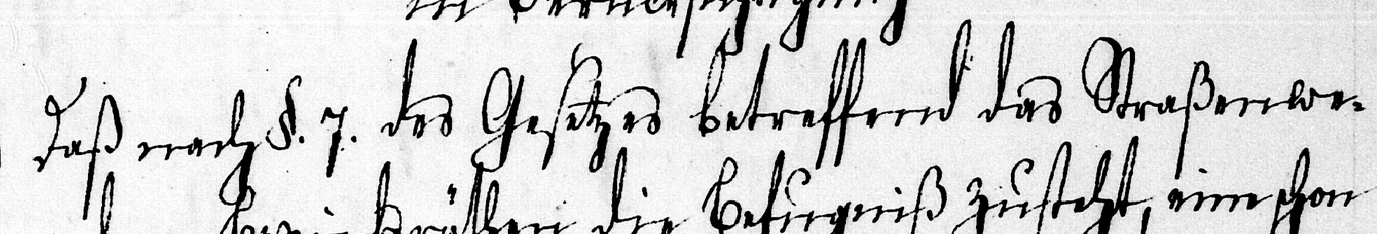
Daß nach §. 7. des Gesetzes betreffend das Straßenwe¬
